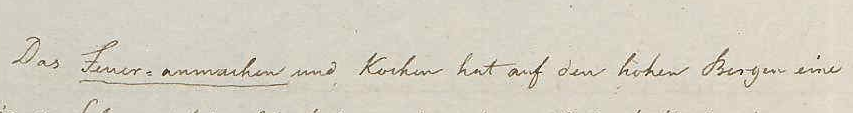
Das Feuer-anmachen und Kochen hat auf den hohen Bergen eine
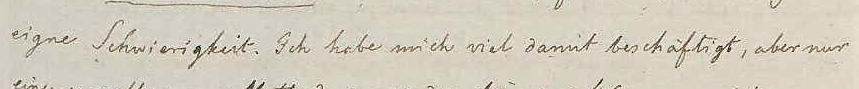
eigne Schwierigkeit. Ich habe mich viel damit beschäftigt, aber nur
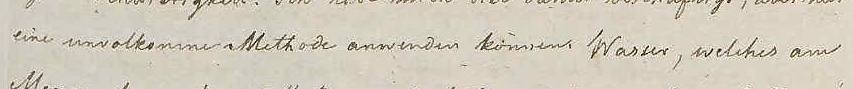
eine unvolkomne Methode anwenden können. Wasser, welches am
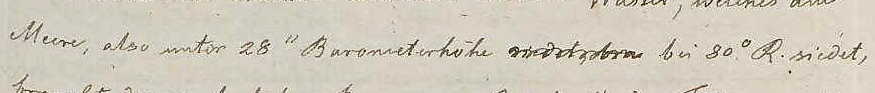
Meere, also unter 28″ Barometerhöhe siedet, brabei 80° R. siedet,
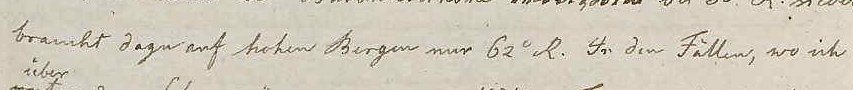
braucht dazu auf hohen Bergen nur 62° R. In den Fällen, wo ich
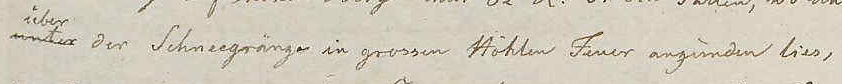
unterüber der Schneegränze in grossen Höhlen Feuer anzünden lies,
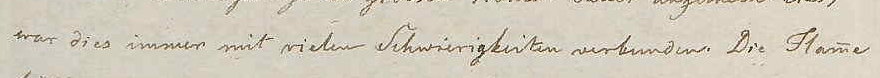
war dies immer mit vielen Schwierigkeiten verbunden. Die Flam̃e
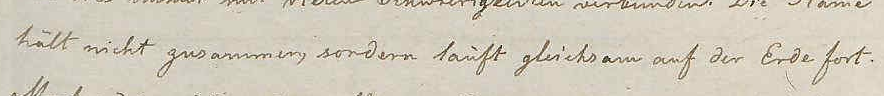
hält nicht zusammen, sondern läuft gleichsam auf der Erde fort.
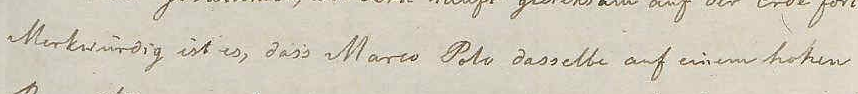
Merkwürdig ist es, dass Marco Polo dasselbe auf einem hohen
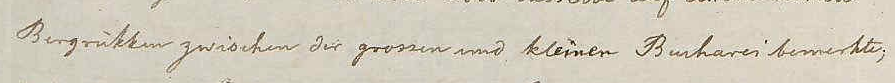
Bergrükken zwischen der grossen und kleinen Bucharei bemerkte;
